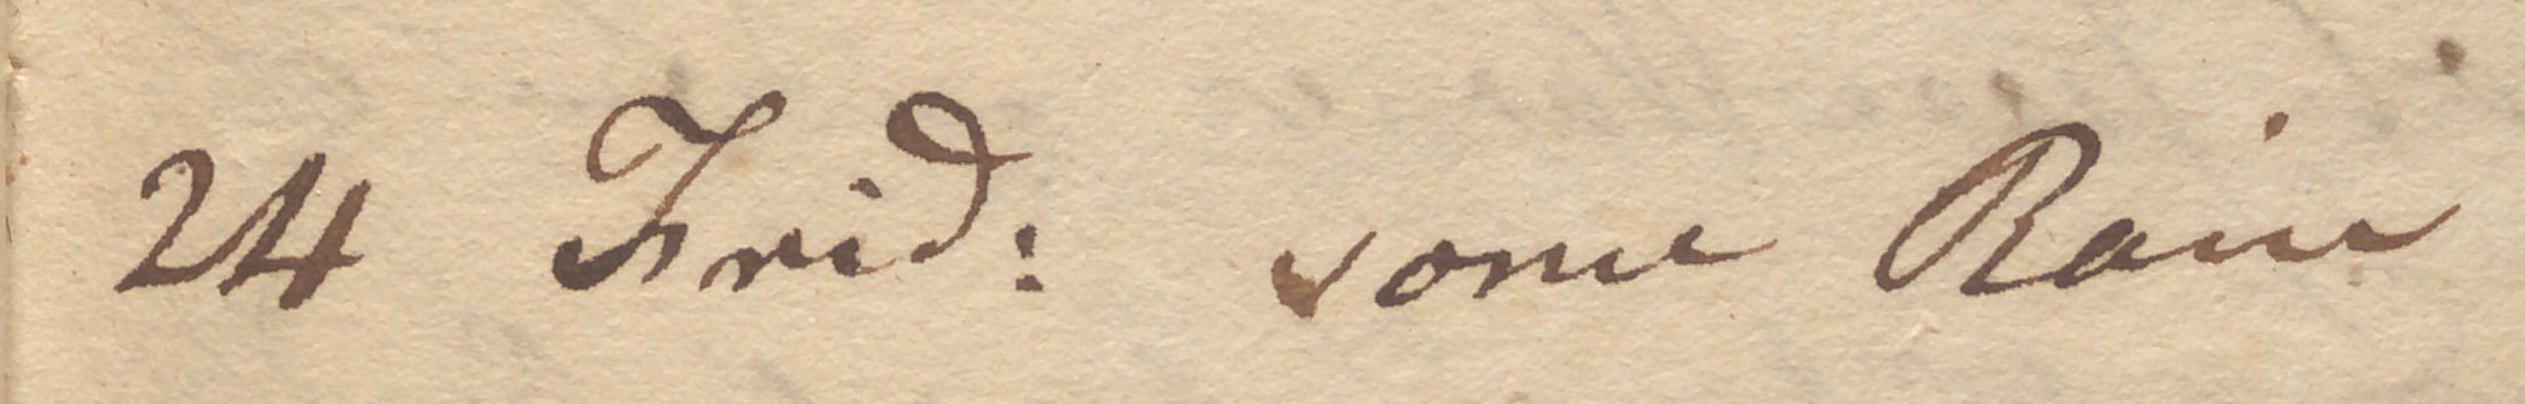24 Frid: some Rain
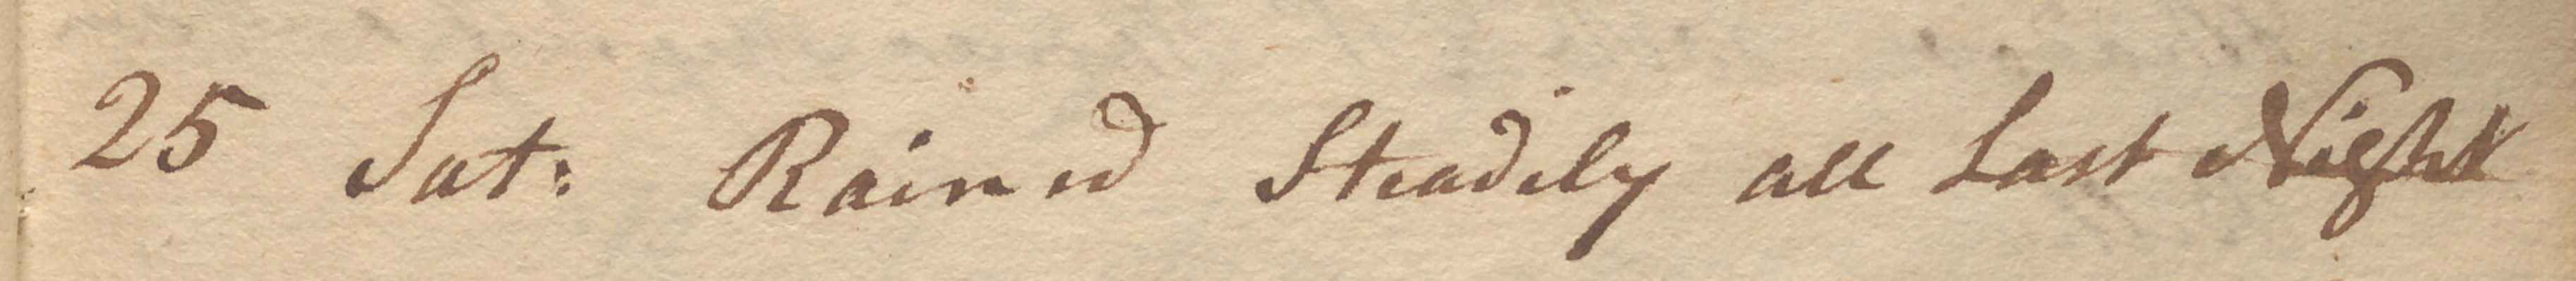25 Sat. Rained Steadily all Last Night
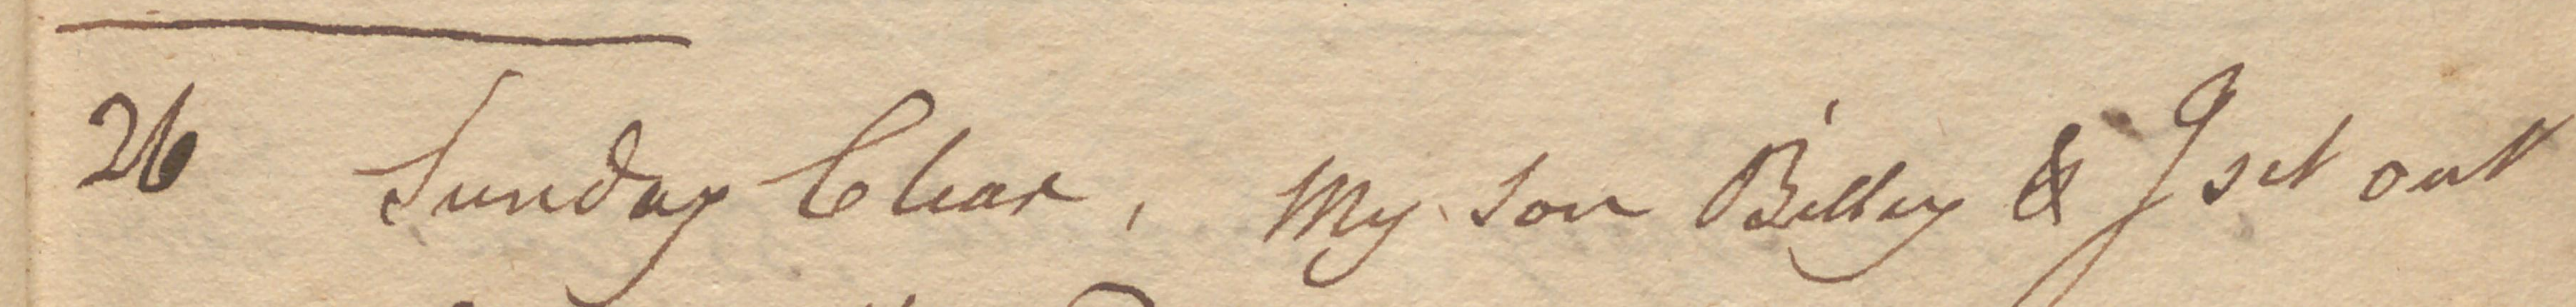26 Sunday Clear, My Son Billey & I set out
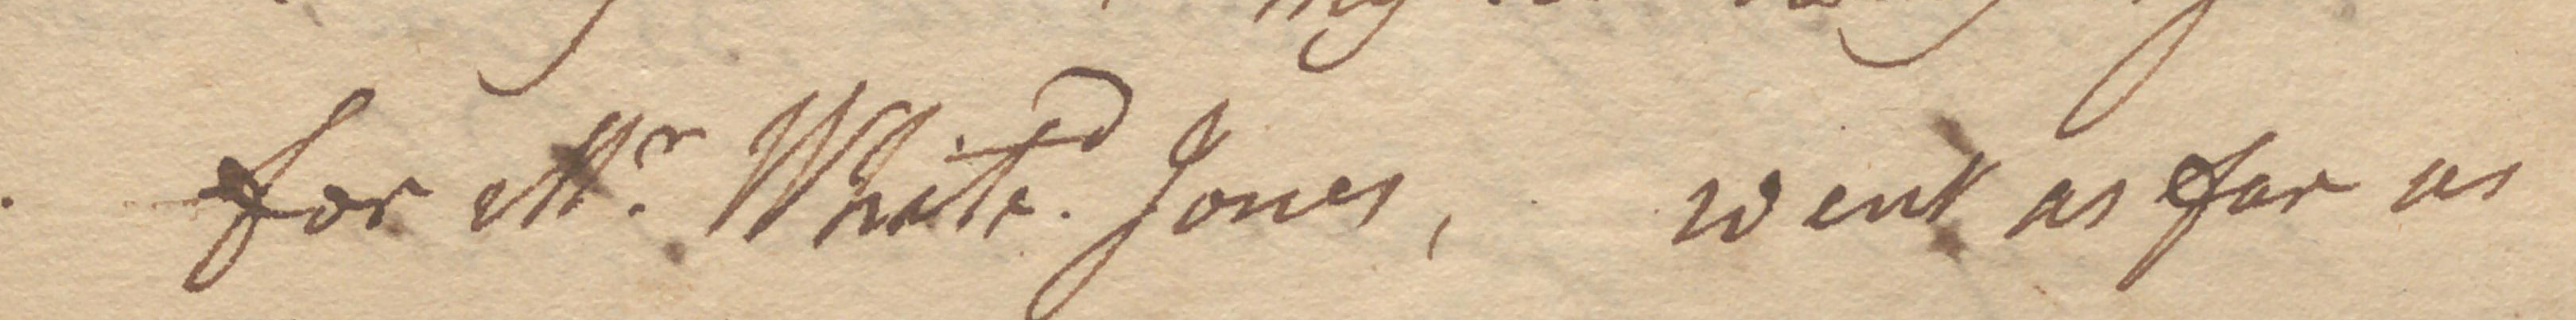for M^r. White^d. Jones, went as far as
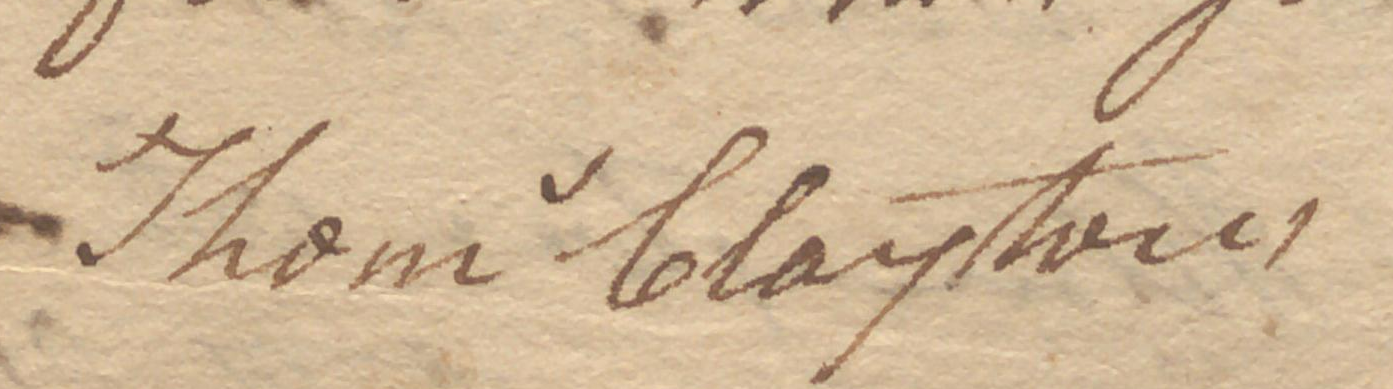Thom^s. Claytons
